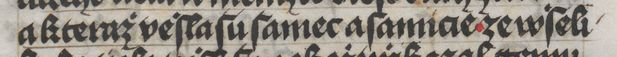a kteraż veẛla ſu ſamec a ſamicie.ze wẛeli¬
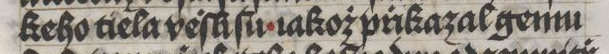keho tiela veẛli ſu.iakoż pṙikazal gemu
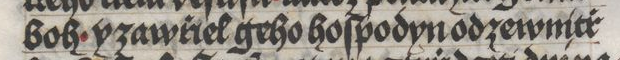boh.y zawṙiel geho hoſpodyn od zewnítř¬
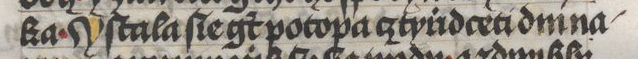ka.Y ſtala ſie ḡt potopa cztyṙidceti dni na¬
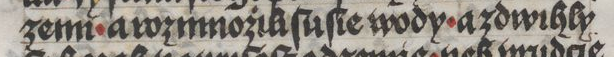zemi.a rozmnożili ſu ſie wody.a zdwihly
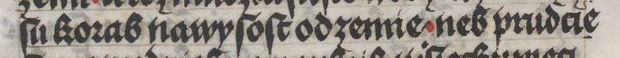ſu korab nawyſoſt od zemie.neb prudcie
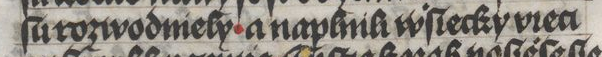ſu rozwodniely.a naplnili wẛiecky vieci
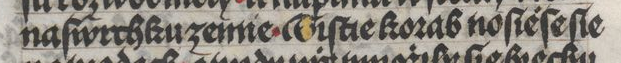naſwrchku zemie.Giſtie korab noſieẛe ſie
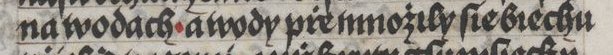na wodach.a wody pṙemnożily ſie biechu
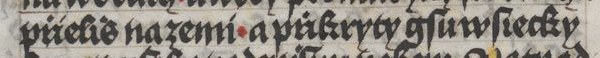pṙíeliš na zemi.a pṙikryty gſu wſiecky
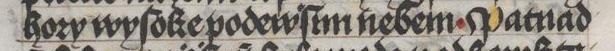hory wyſoke podewẛím nebem.Patnad¬
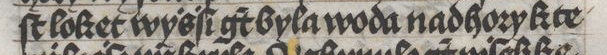ſt loket wyṡẛi ḡt byla woda nad hory kte¬
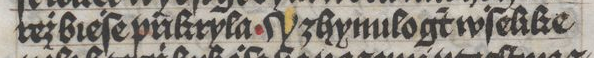reż bieſe pṙikryla.Yzhynulo ḡt wẛelike
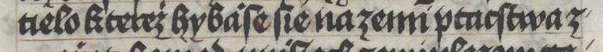tielo kterež hybaẛe ſie na zemi ptacſtwa z¬
